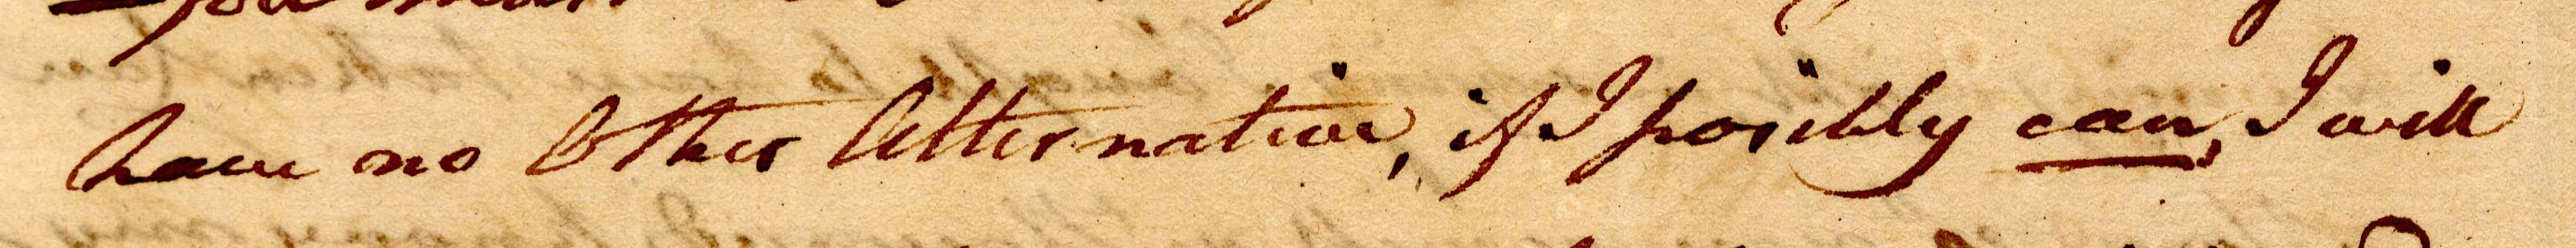have no Other Alternative, if I possibly can, I will
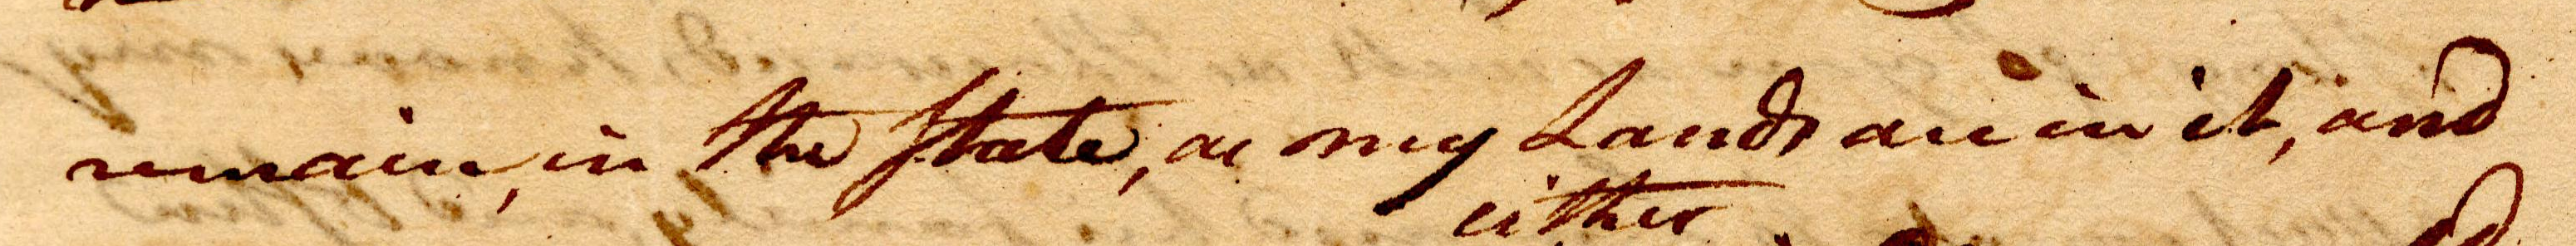remain, in the state, as my Lands are in it, and
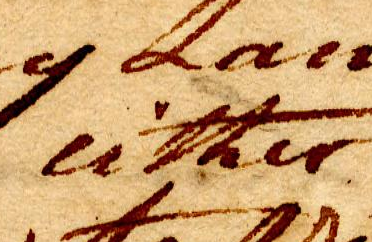either
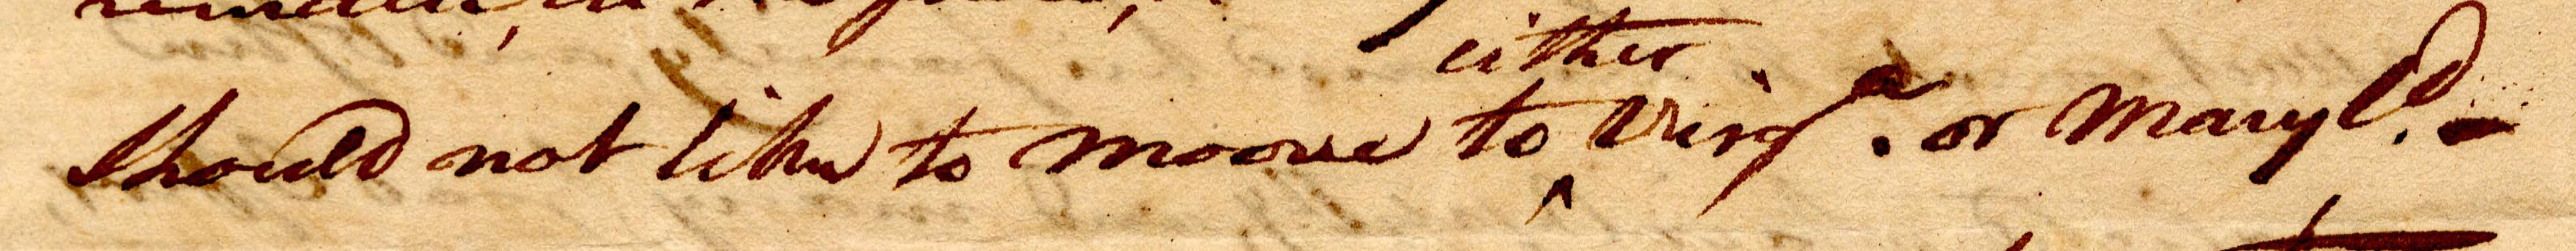should not like to moove to Virg^a. or Maryl^d.
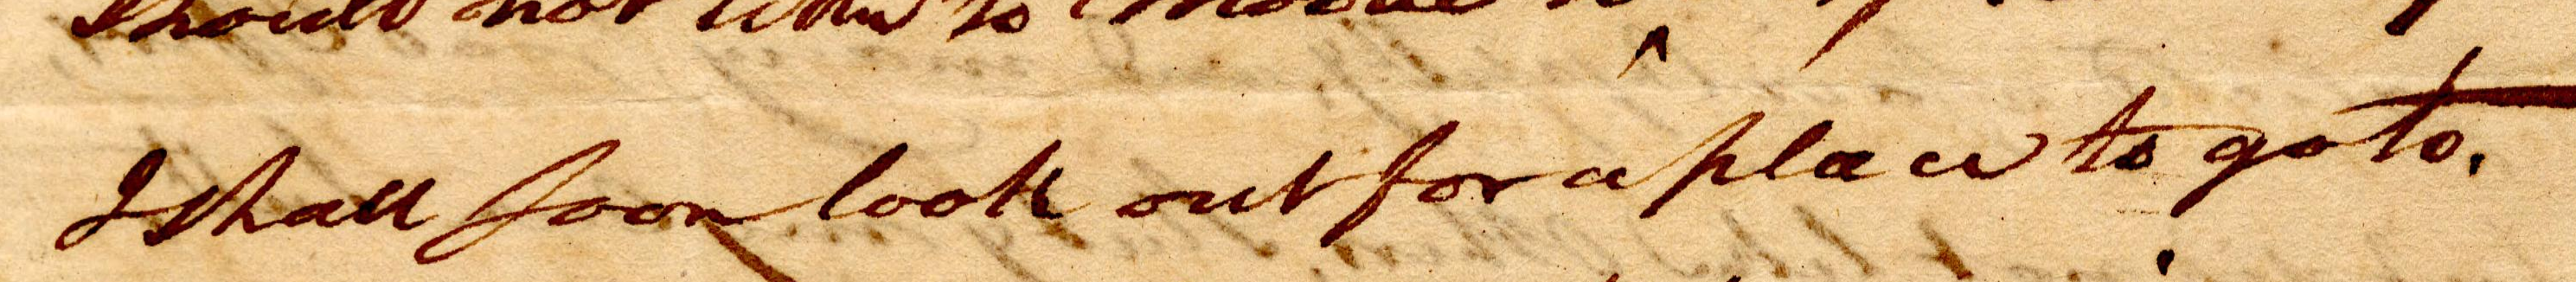I shall soon look out for a place to go to.
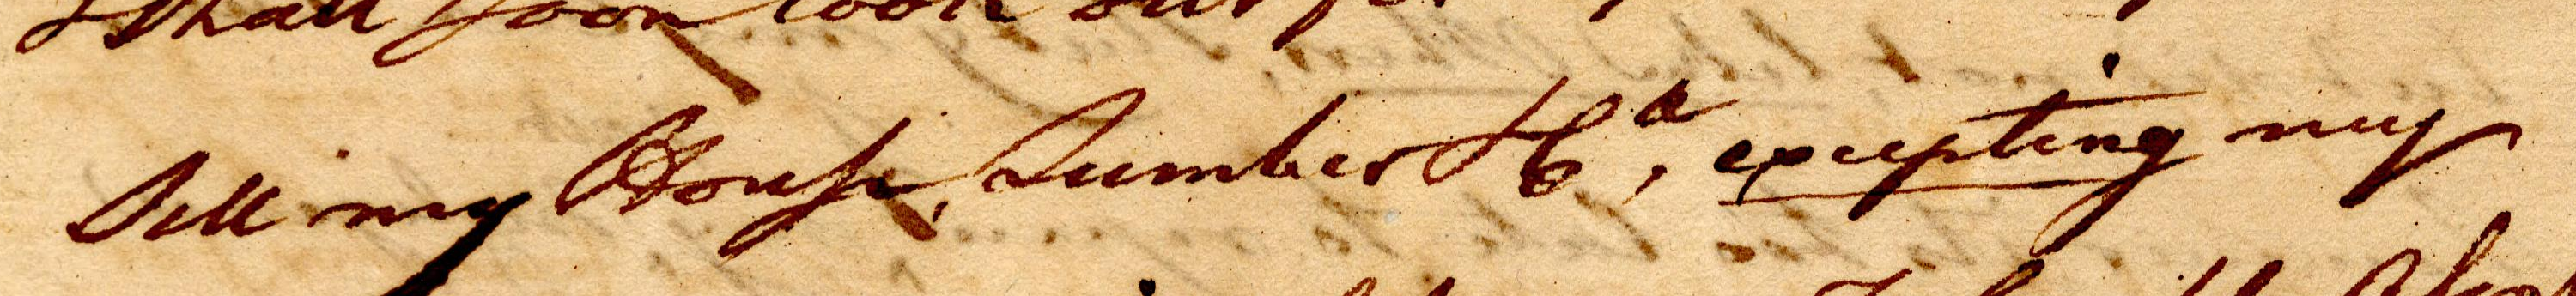sell my house, lumbers & c^a, expecting my
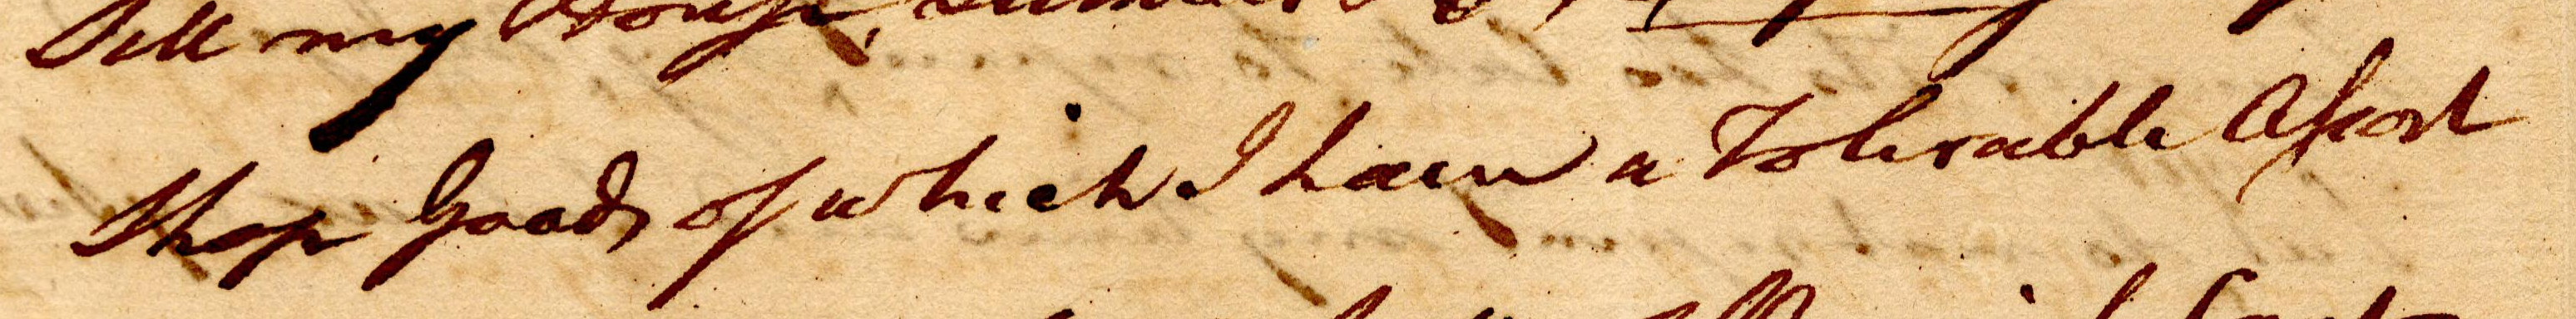shop goods of which I have a Tolerable Assort-
